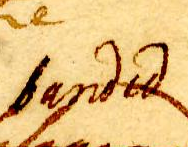banded
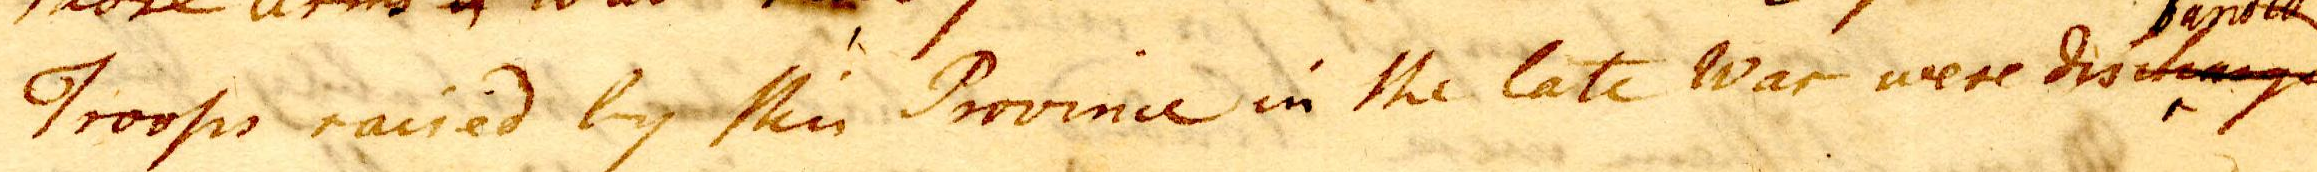Troops raised by this Province in the late War were dis[charged]
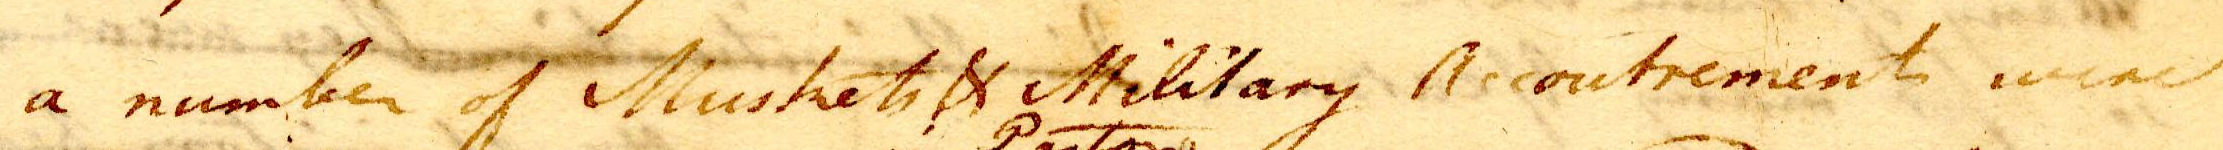a number of Muskets & Military Accoutrement were
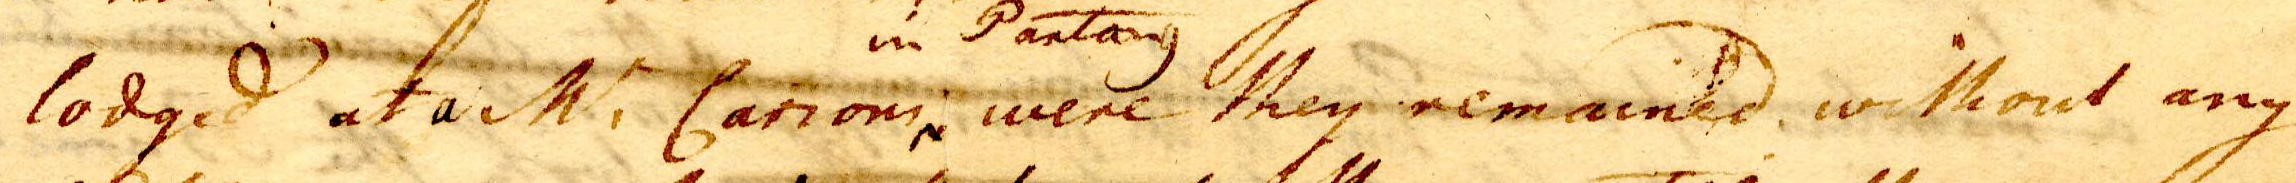lodged at a M^r. Canons ^; were they remained without any
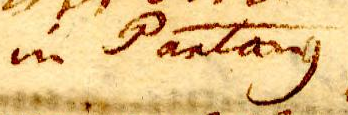in Pantang
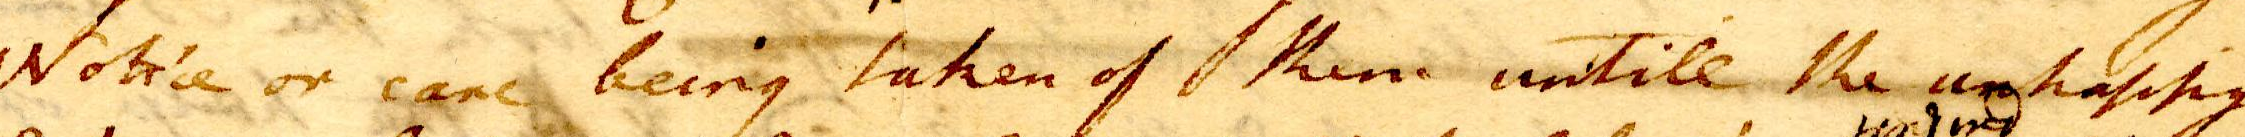Notice or care being taken of them untill the unhappy
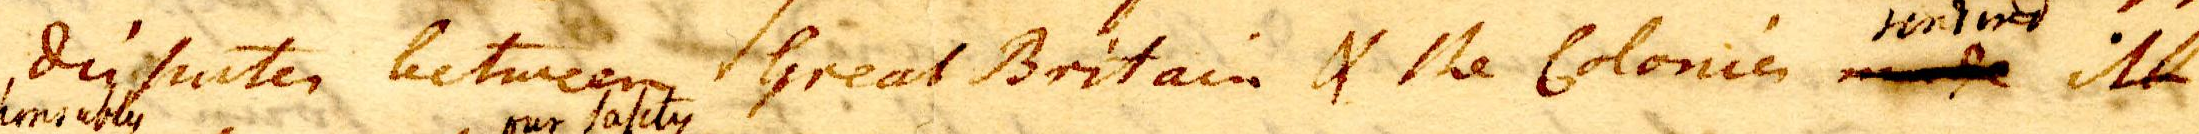disputes between Great Britain & the Colonies [made] it
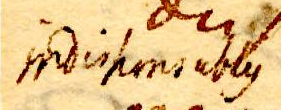indispensably
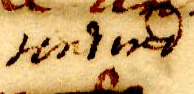render
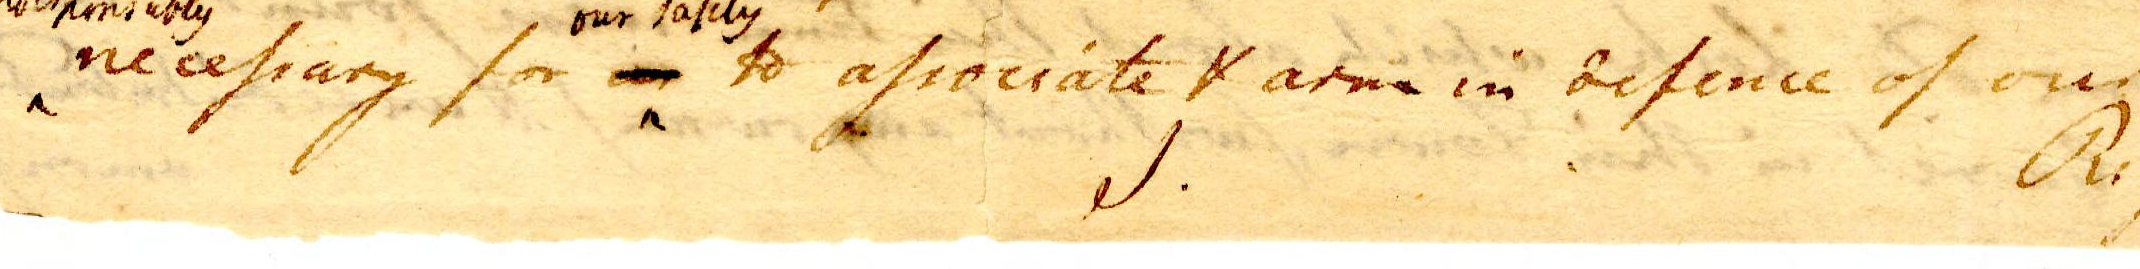^ necessary for [our] to associate & arm in defence of our
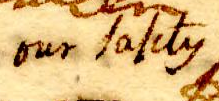our Safety
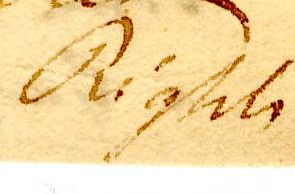Rights
